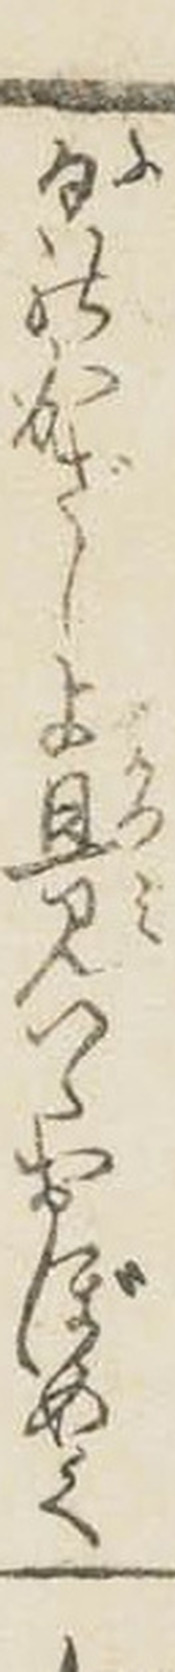日のかざしよ且見つゝおぼめく
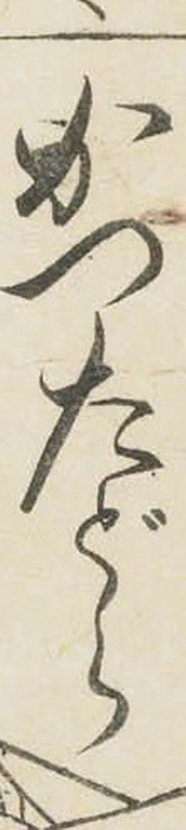かつたどら
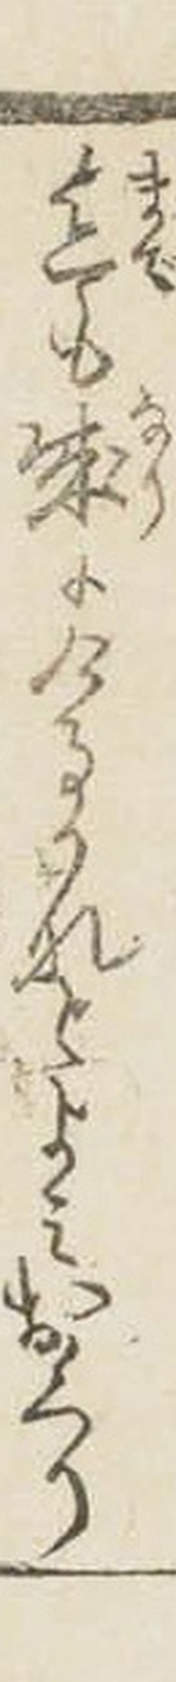迄も成にけるかなとよみおくり
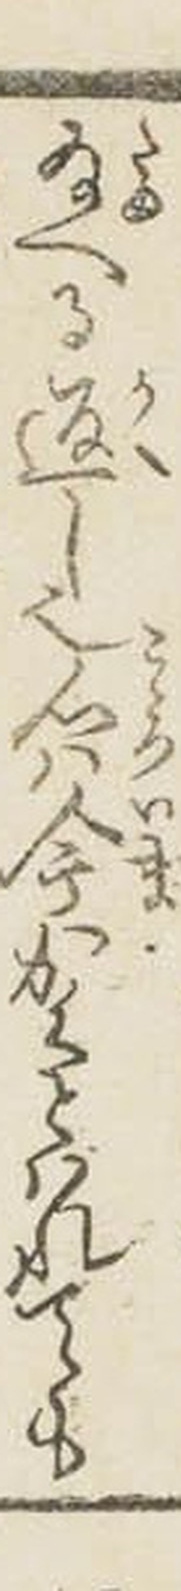給へる返し也心は今かくとはれても
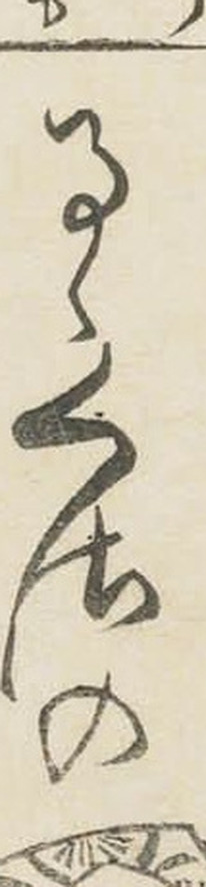るゝくさの
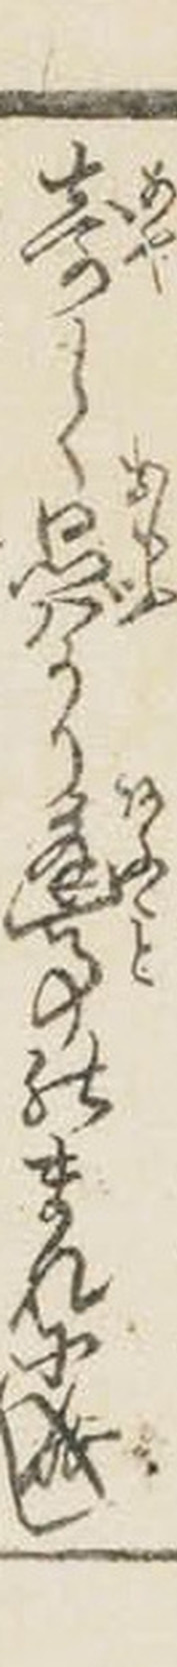奇しく思ばかり逢事のまれに成し
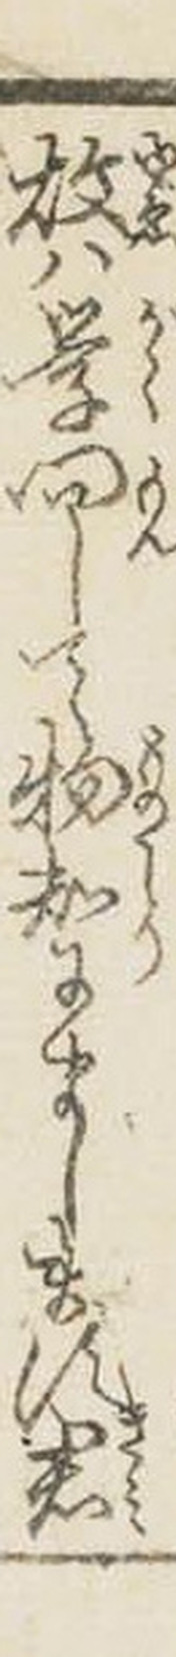故は学問して物知にまします君
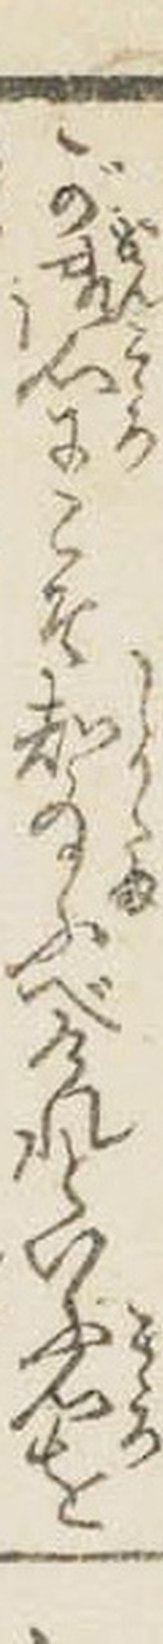が御心にこそ知給ふべけれといふ心を
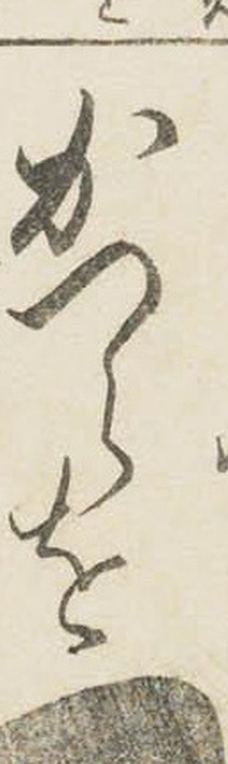かつらを
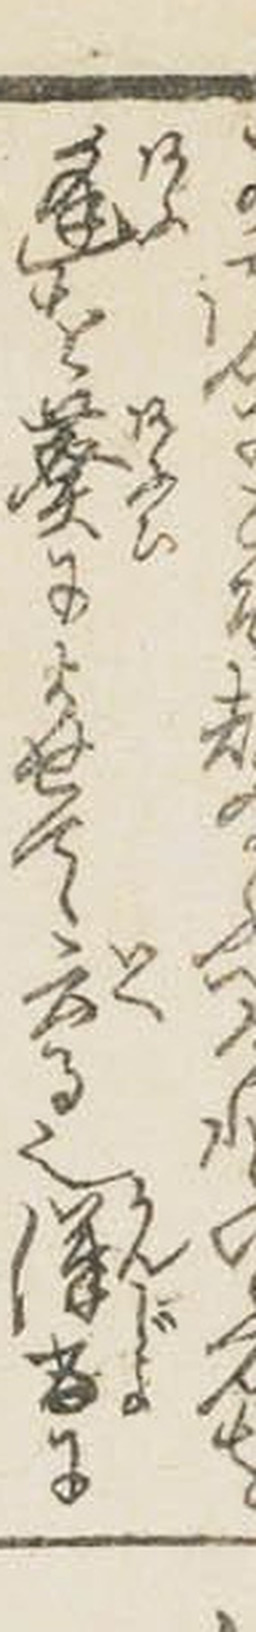逢を葵によせて云る也漢書に
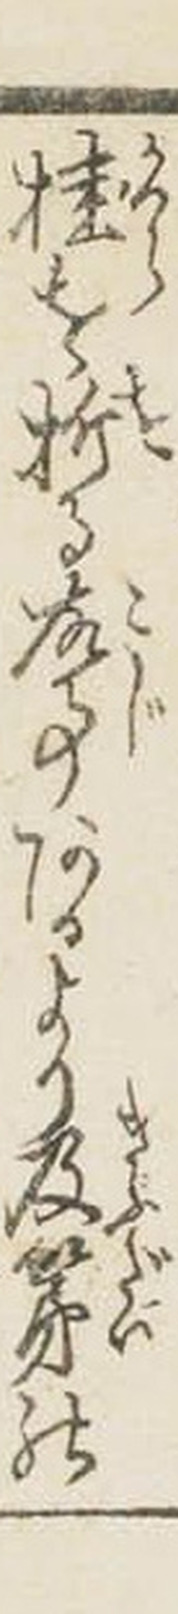桂を折る故事あるより及第の
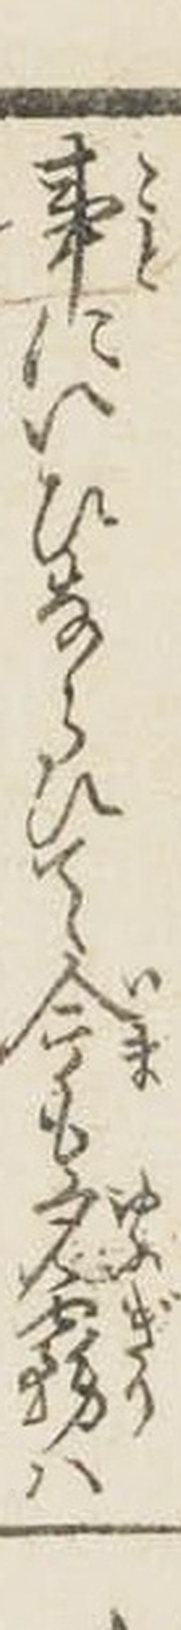事にいひならひて今も夕霧は
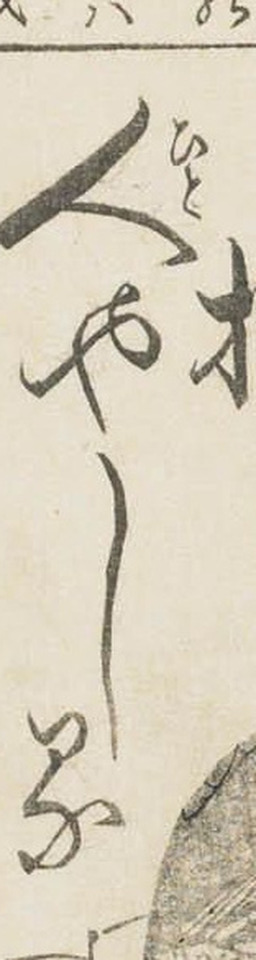人やしる
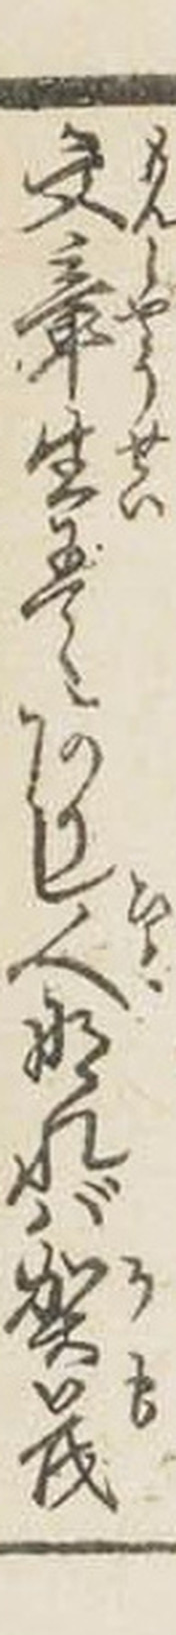文章生にてありし人なれば加茂
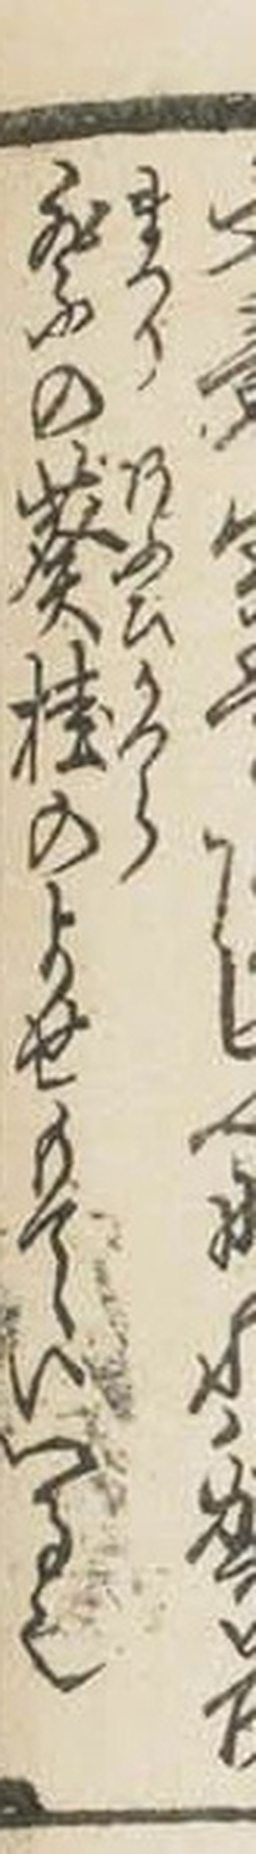祭の葵桂のよせもていへる也
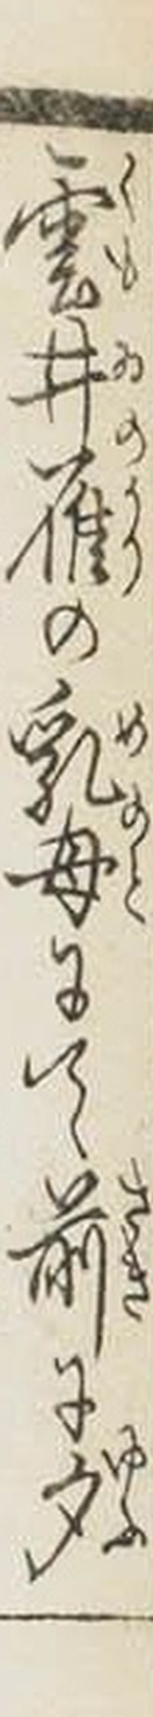雲井雁の乳母にて前に夕
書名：源氏百人一首
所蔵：東京学芸大学教育コンテンツアーカイブ
